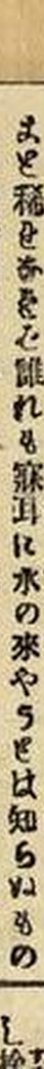こと稀れなれば誰れも寐耳に水の來やうとは知らぬもの
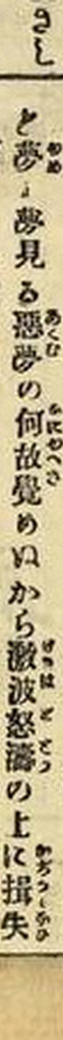と夢に夢見る惡夢の何故覺めぬから激波怒濤の上に揖失
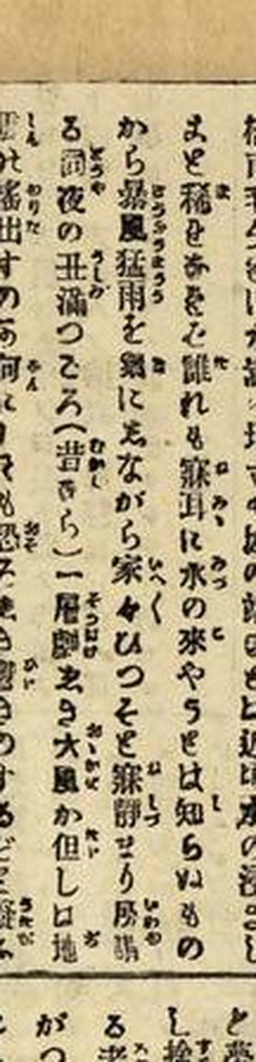から暴風猛雨を氣にしながら家々ひつそと寐静まり所謂
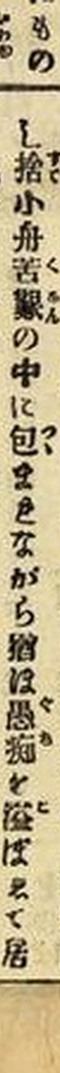し捨小舟苦艱の中に包まれながら猶ほ愚痴を溢ぼして居
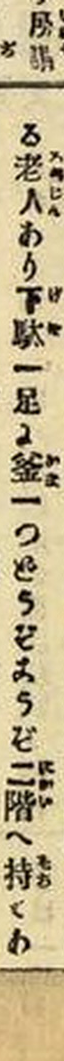る老人あり下駄一足に釜一つどうぞこうぞ二階へ持てあ
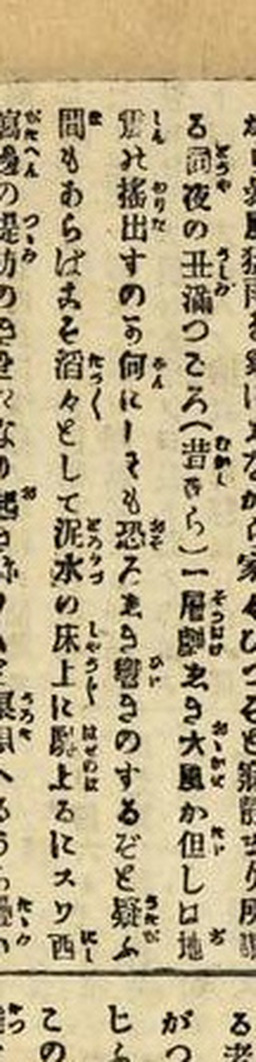震の揺出すのか何にしても恐ろしき響きのするぞと疑ふ
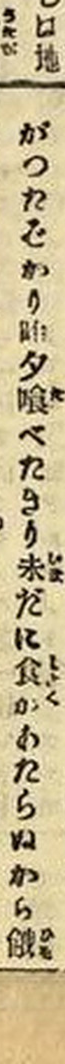がつたばかり昨夕喰べたきり未だに食があたらぬから餓
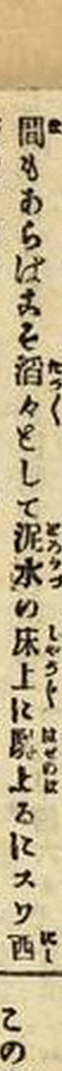間もあらばこそ滔々として泥水の床上に馳上るにスワ西
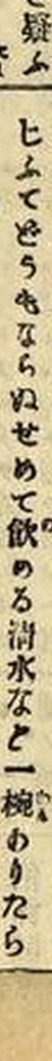じふてどうもならぬせめて飲める清水など一椀ありたら
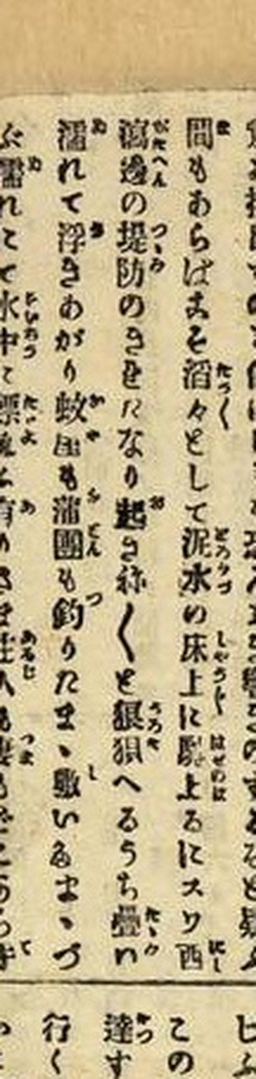潟邊の堤防きれたなり起きね〳〵と狼狽へるうち畳は
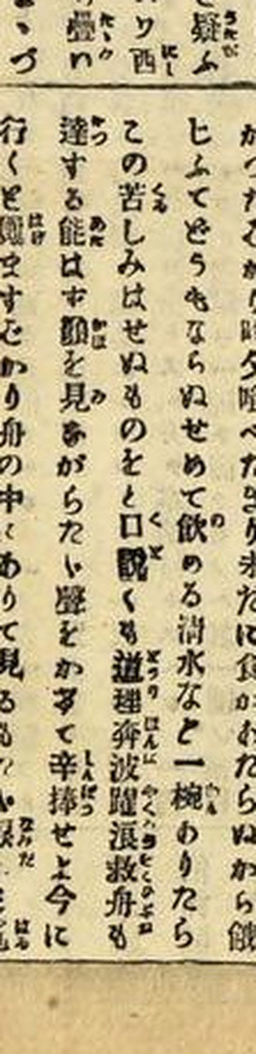この苦しみはせぬものをと口説くも道理奔波躍浪救舟も
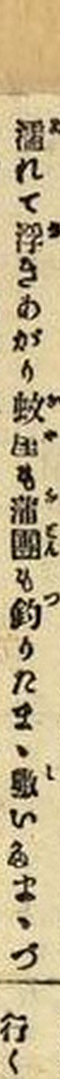濡れて浮きあがり蚊屋も蒲團も釣りたまゝ敷いたまゝづ
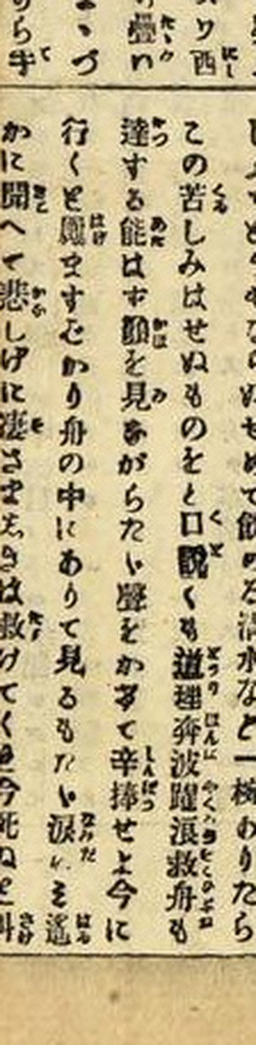達する能はず顔を見ながらたゞ聲をかけて辛棒せよ今に
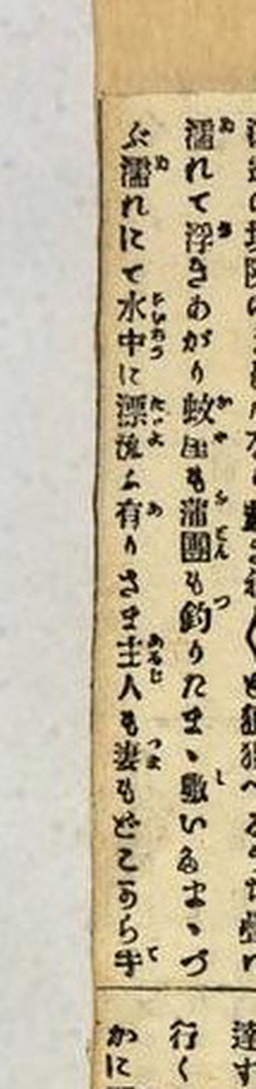ぶ濡れにて水中に漂流ふ有りさま主人も妻もどこから手
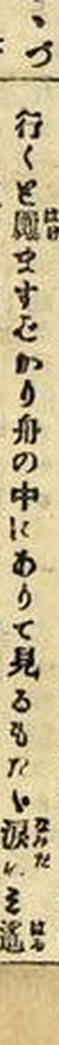行くと励ますばかり舟の中にありて見るもたゞ涙のみ遥
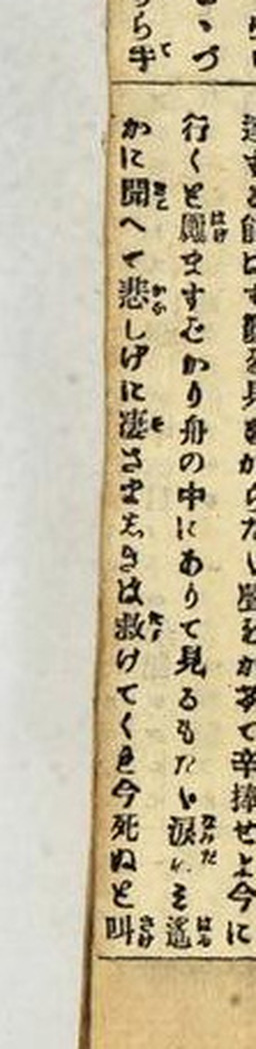かに聞へて悲しげに凄さましきは救けてくれ今死ぬと叫
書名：温古集 五巻
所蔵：福井県文書館 Fukui Prefectural Archives
